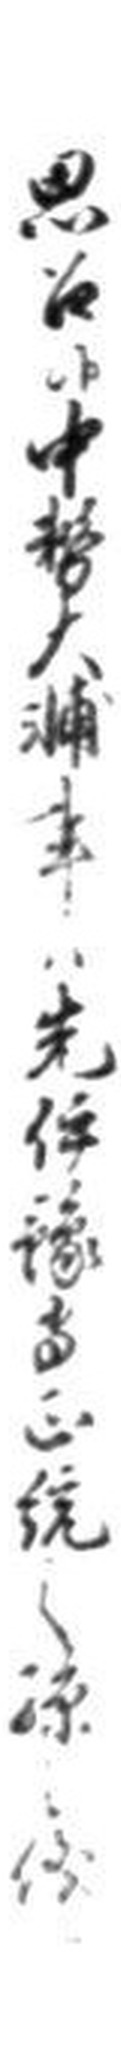思召候中務大輔事ハ先伊予守正統之孫之儀
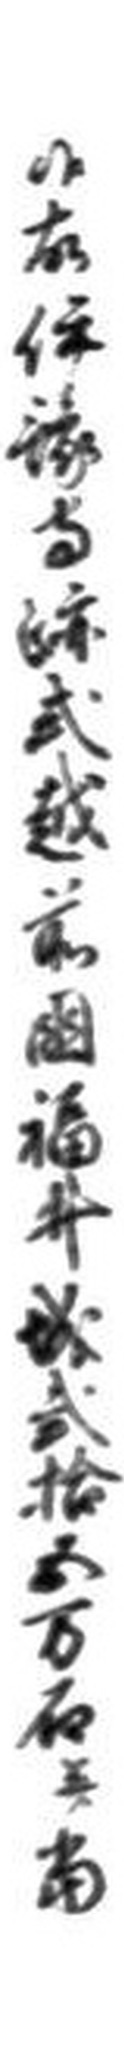候故伊予守跡式越前国福井城弐拾五万石并当
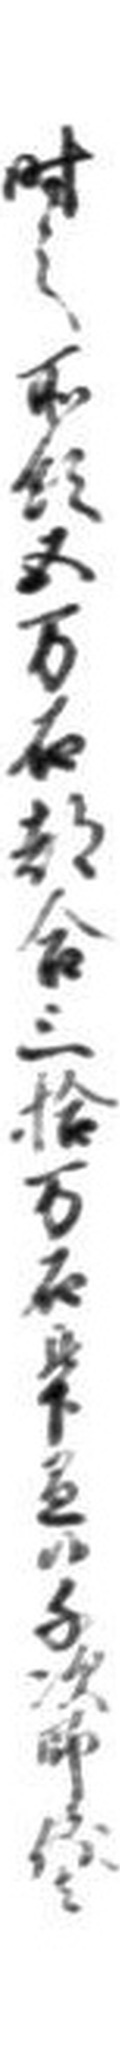時之所領五万石都合三拾万石被下置候千次郎儀者
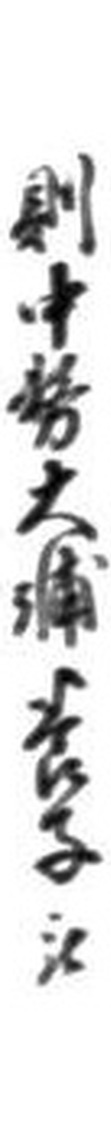則中務大輔養子被
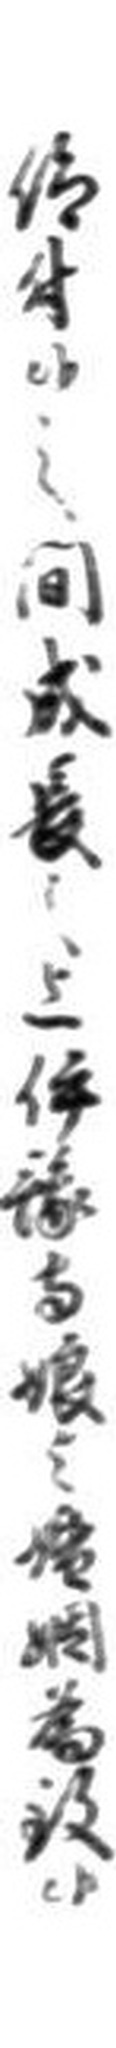仰付候之間成長之上伊予守娘与婚姻為致候
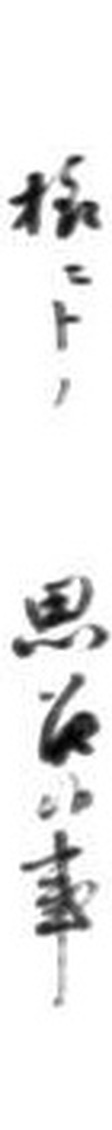様ニトノ思召候事
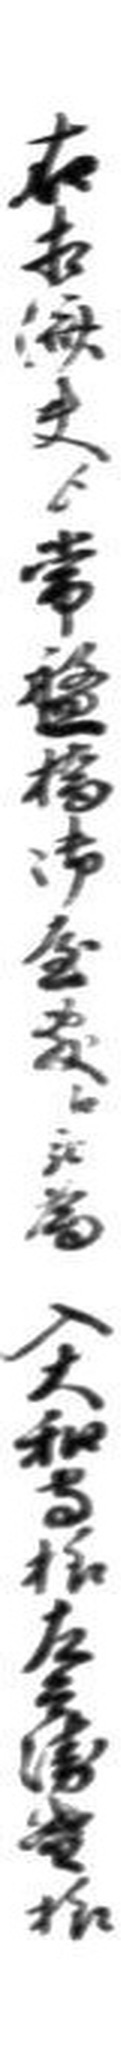右相済夫ゟ常盤橋御屋敷江被為入大和守様左兵衛督様
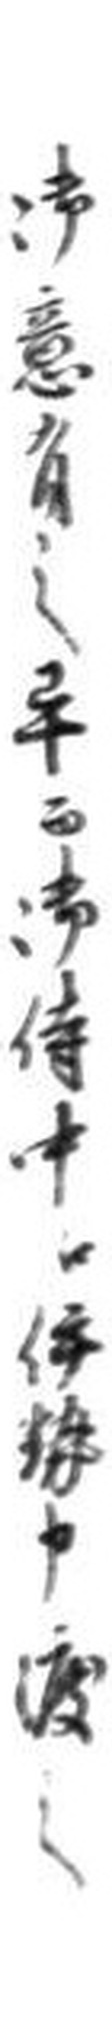御意有之畢而御侍中江伊勢申渡之

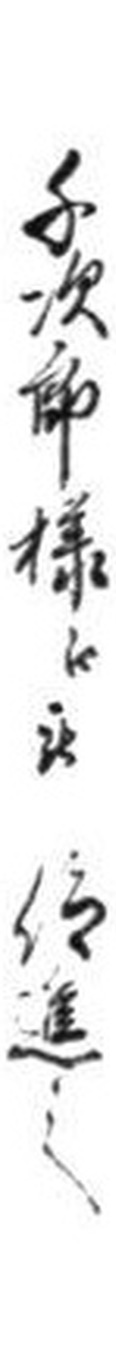千次郎様江被仰進之
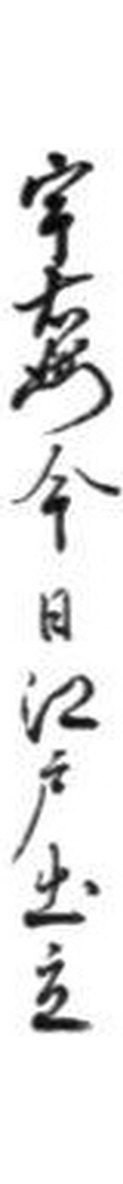宇右衛門今日江戸出立
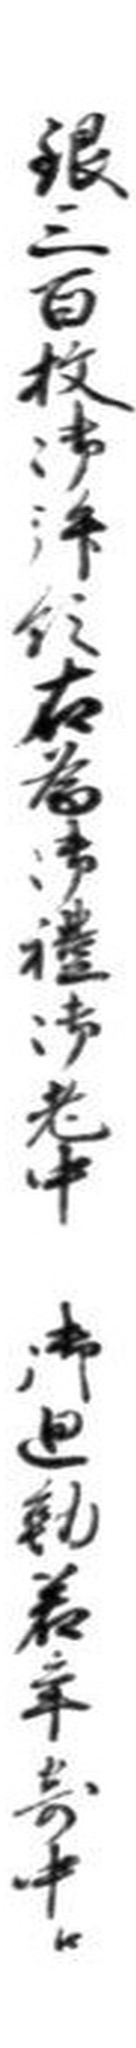銀三百枚御拝領右為御礼御老中御廻勤若年寄中江
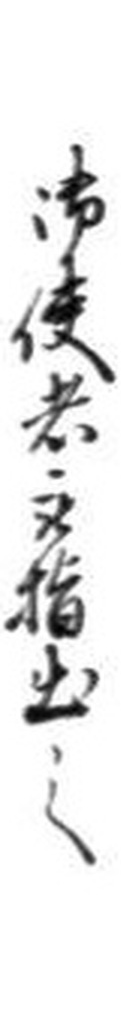御使者被指出之
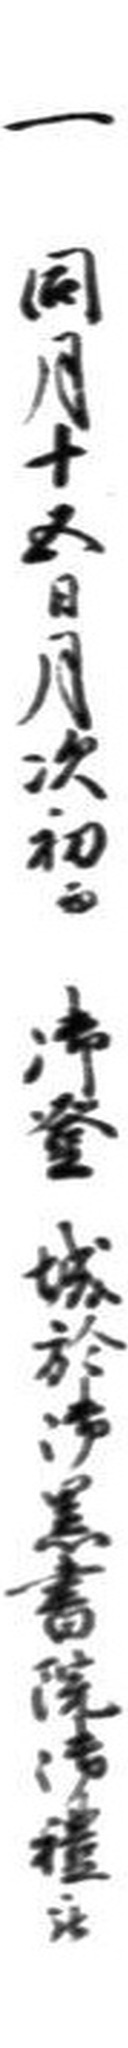一同月十五日月次初而御登城於御黒書院御礼被
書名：家譜 三十五 宗昌公 従享保六年到同七年
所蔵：福井県文書館 Fukui Prefectural Archives
